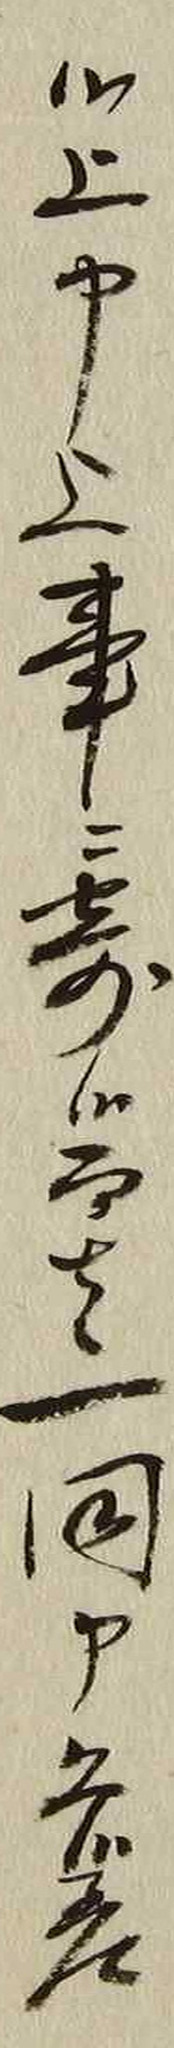候上申上事ニ寄候而者一同申上候差
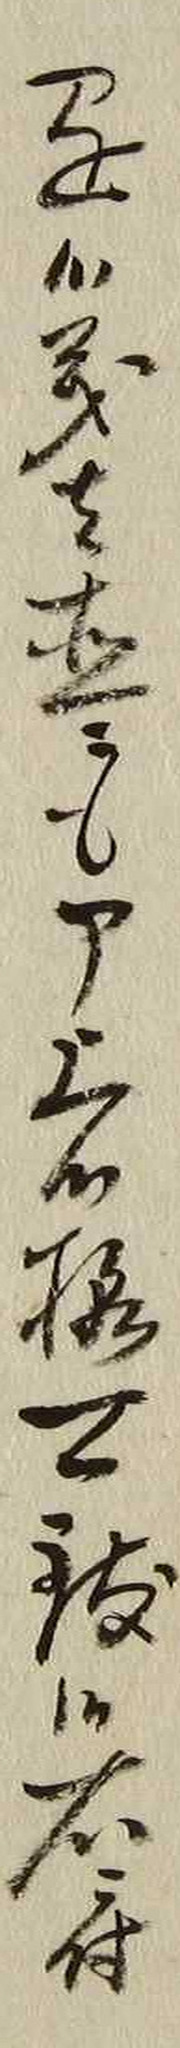懸候義者直ニも申上候様可致候右ニ付
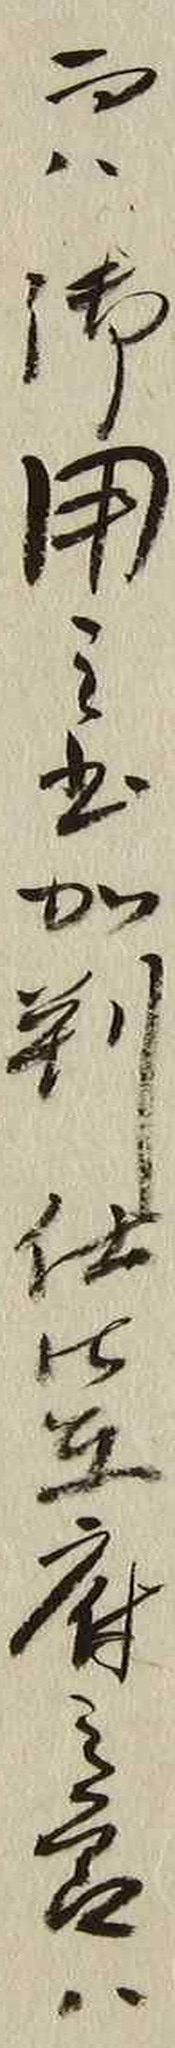而ハ御用之書加判仕御在府之節ハ
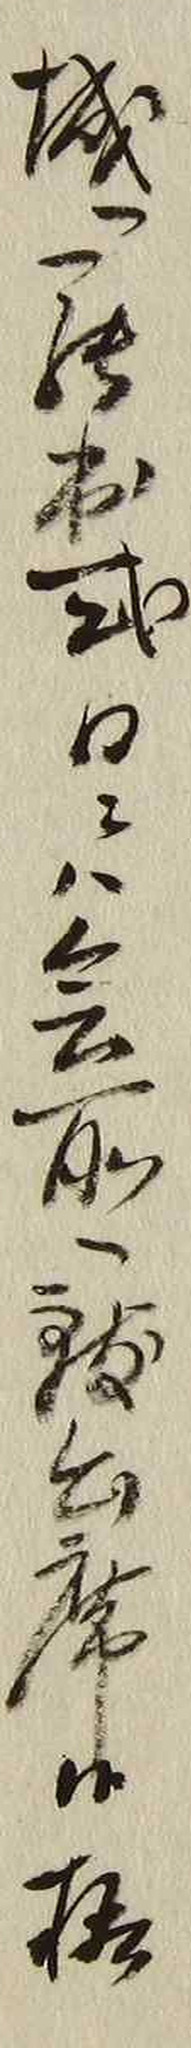城へ罷出式日ニハ会所へ致出席候様
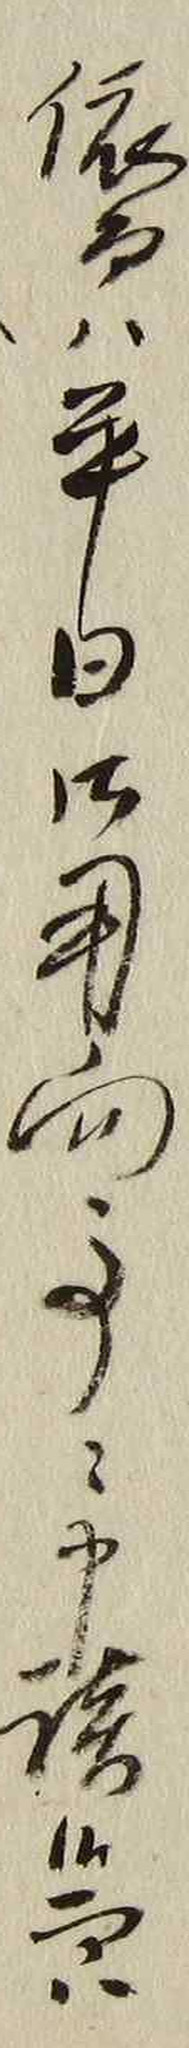依而ハ平日御用向事々申談候而ハ
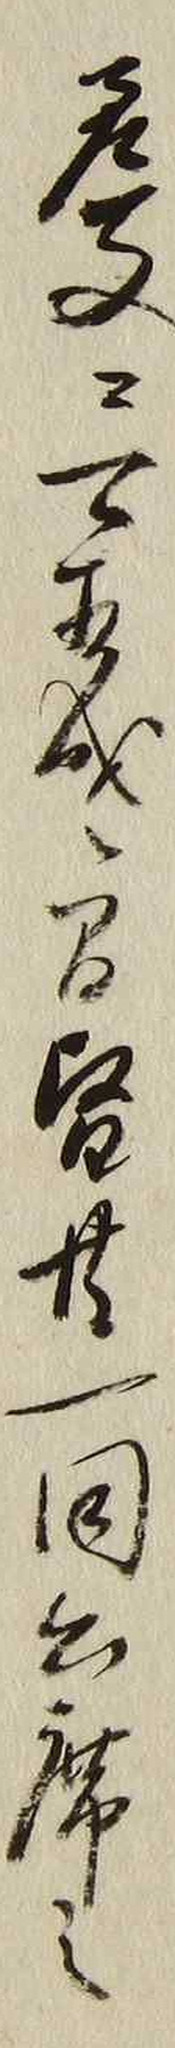差支ニ可相成候間皆共一同出席之
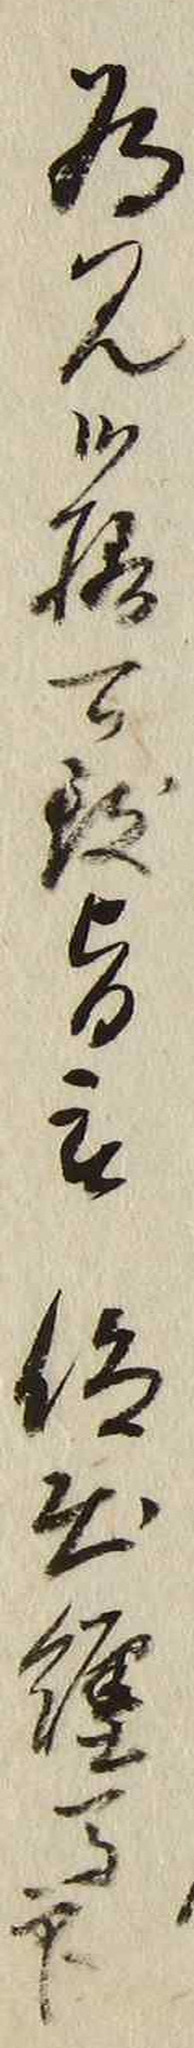為見候様可致旨被仰出纏馬印

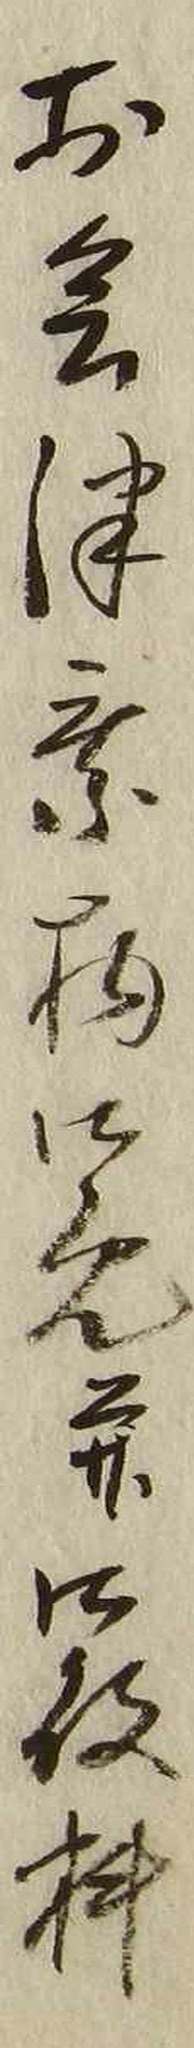於会津乗物御免并御役料
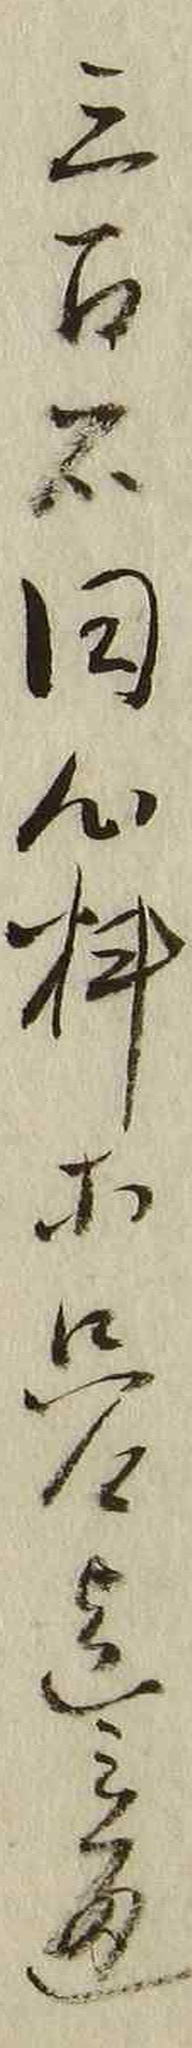三百石同心料等只合迄之通
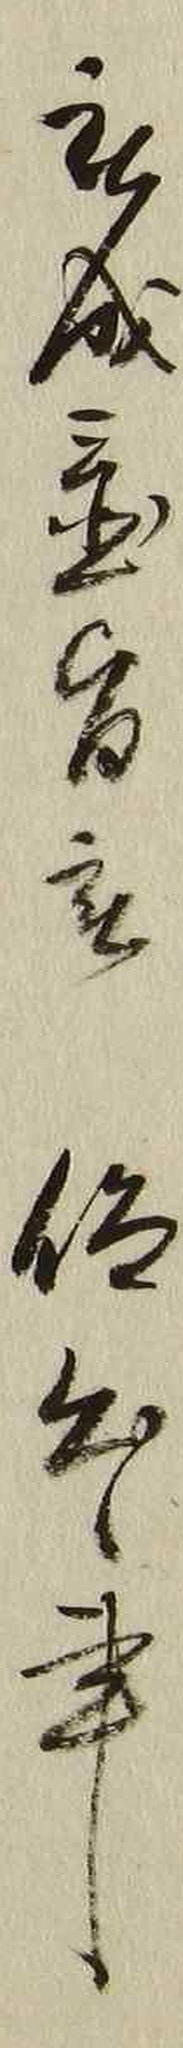被成置旨被仰出候事
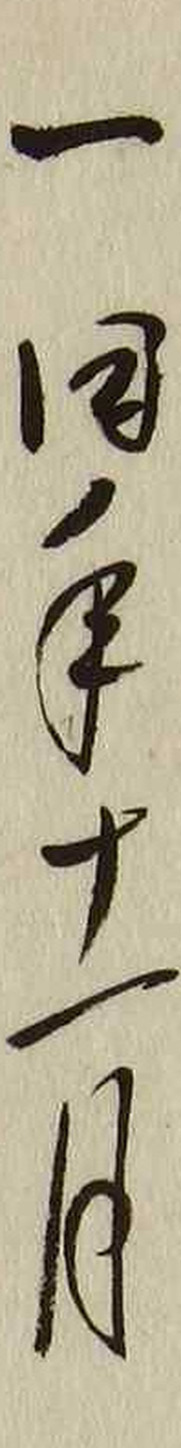一同年十一月
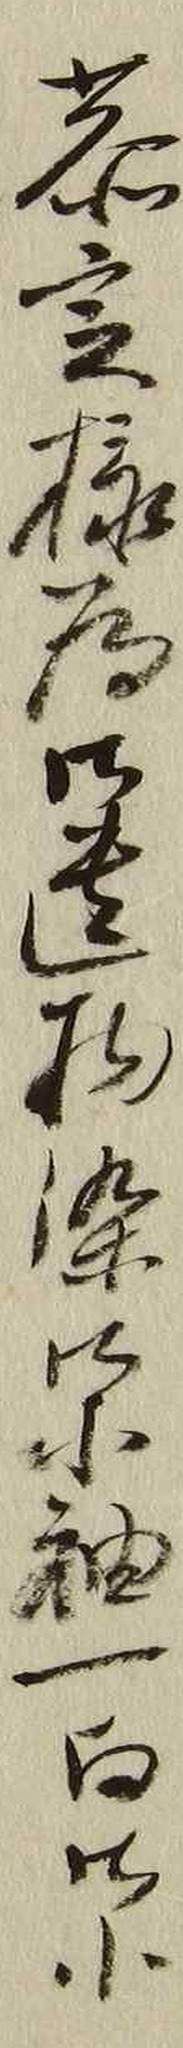恭定様為御遺物染御小袖一白御小
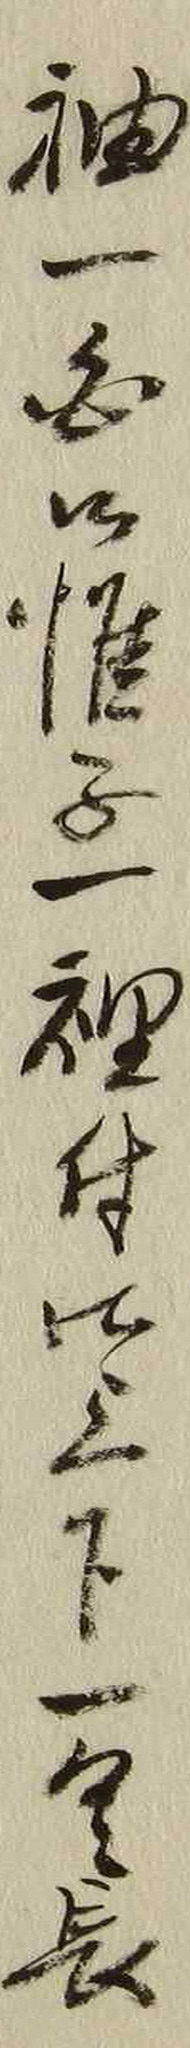袖一白御帷子一裏付御上下一具長
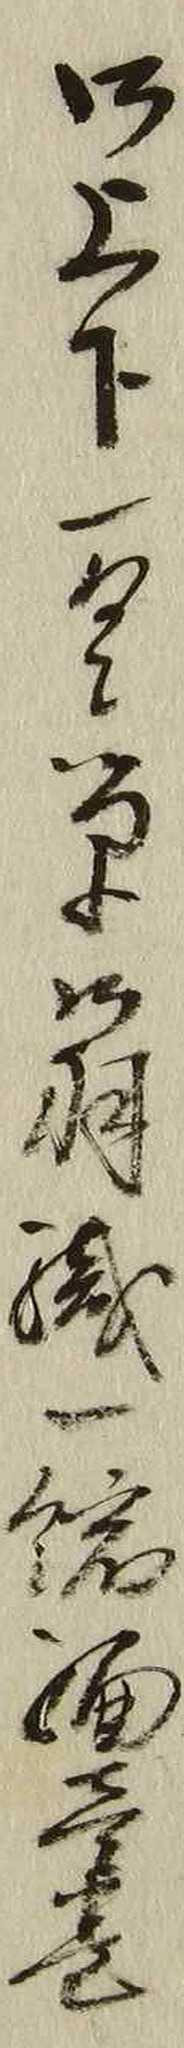御上下一具単御羽織一縮緬壱巻
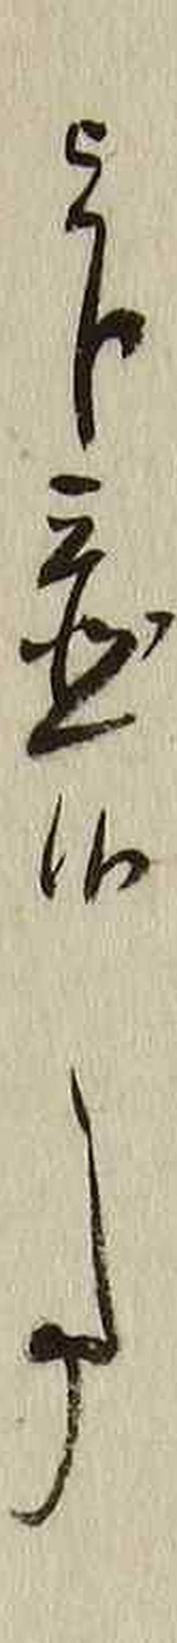被下置候事
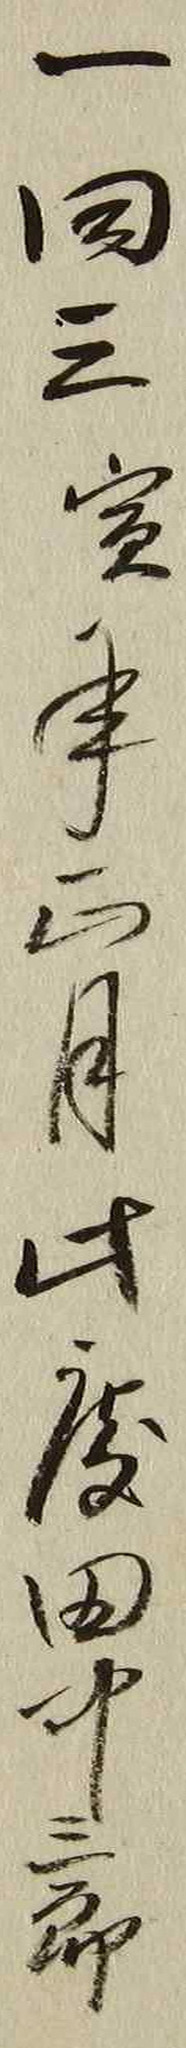一同三寅年正月此度田中三郎
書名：諸士系譜　巻之351　す之部1
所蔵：会津若松市立会津図書館
